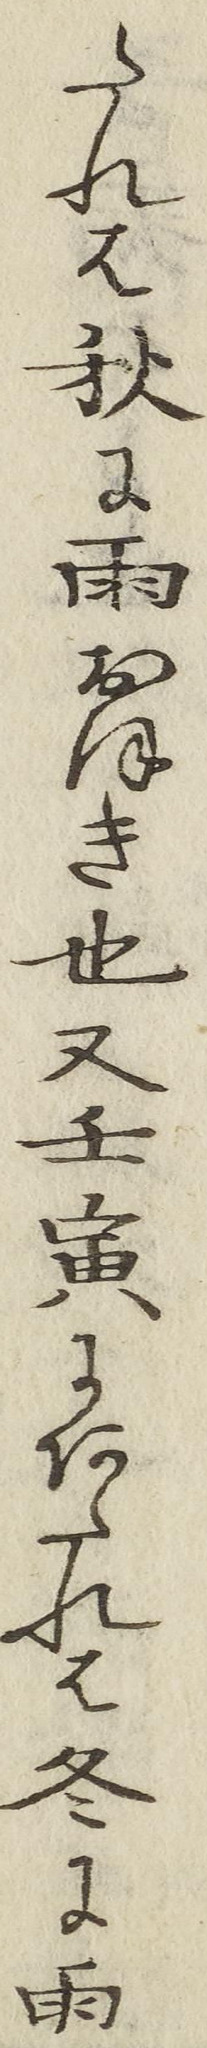たれは秋に雨おほき也又壬寅にあたれは冬に雨
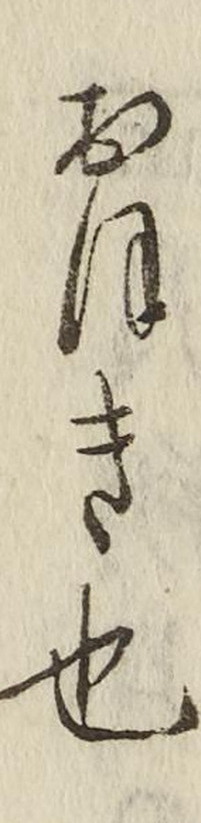おほき也
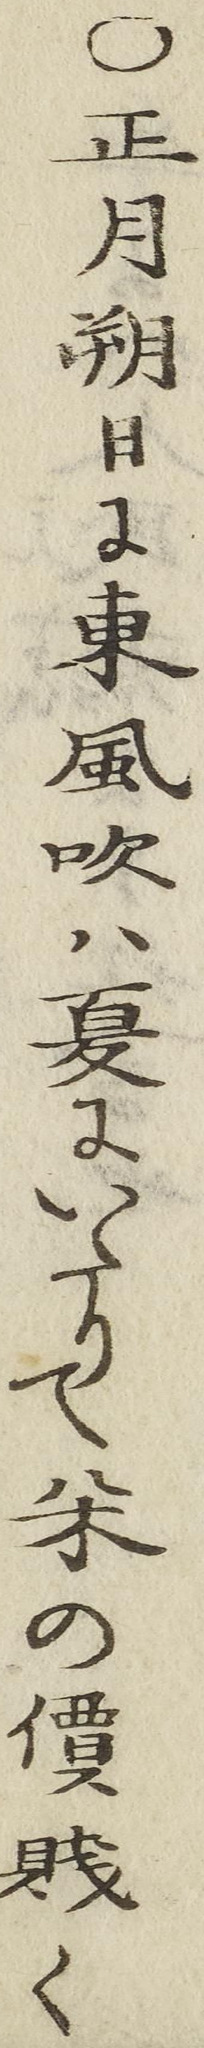〇正月朔日に東風吹は夏にいたりて米の価賤く
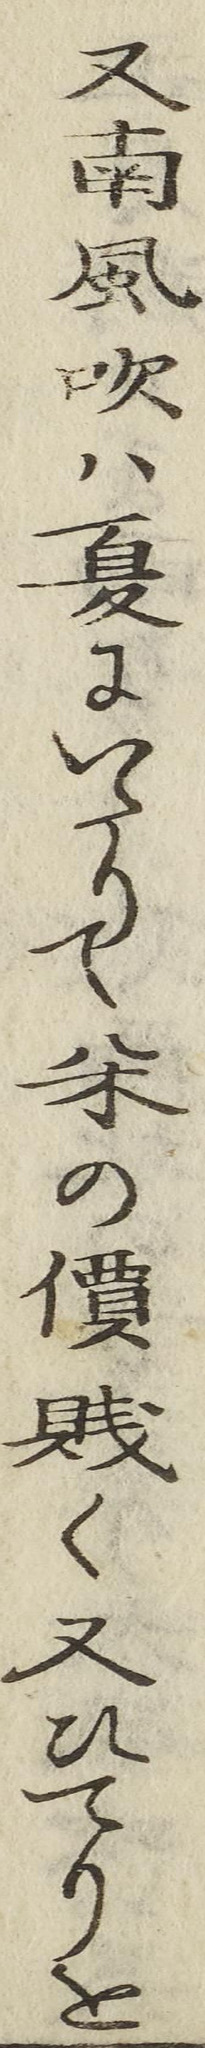又南風吹は夏にいたりて米の価賤く又ひてりを
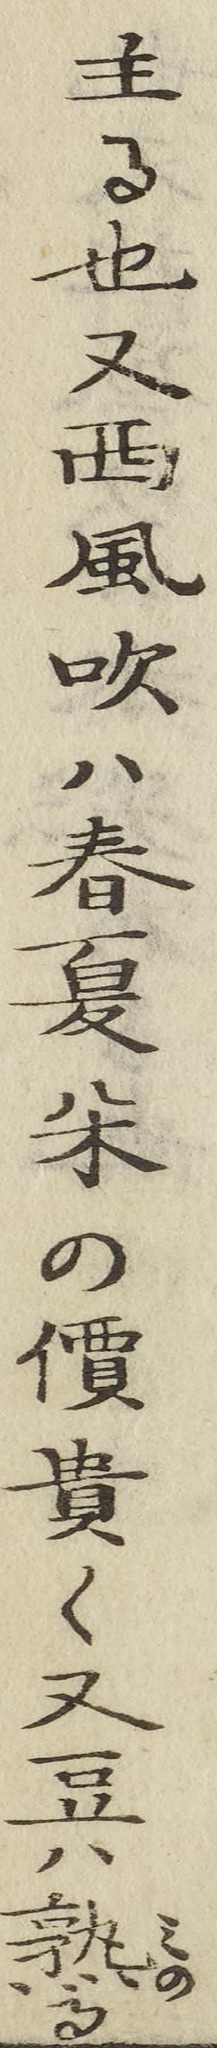主る也又西風吹は春夏米の価貴く又豆は熟る

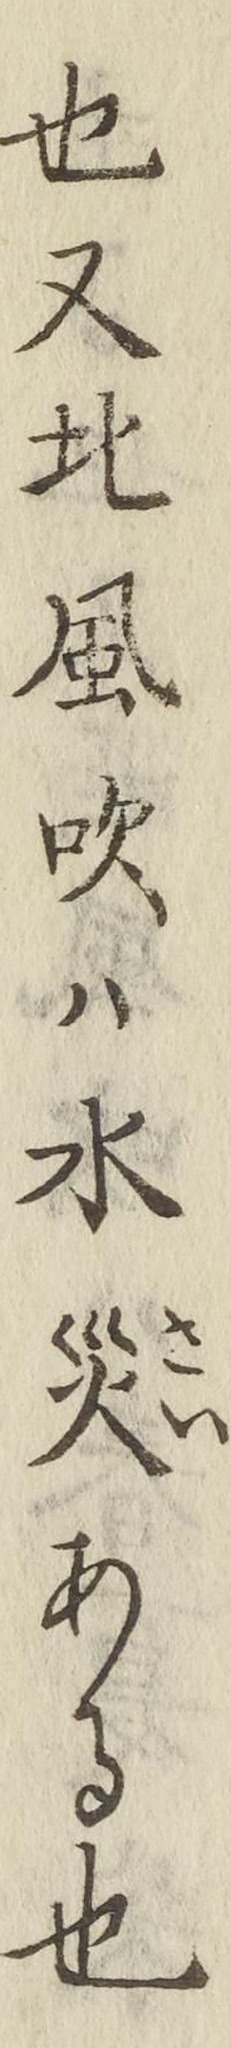也又北風吹は水災ある也
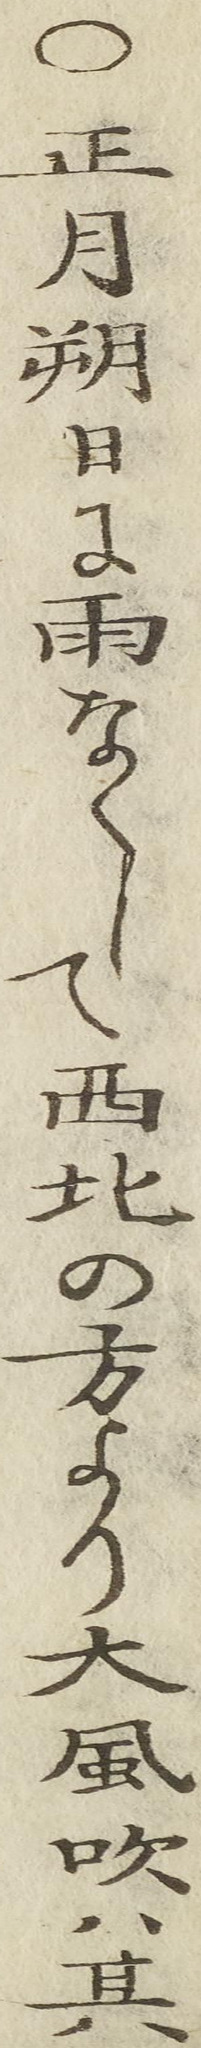〇正月朔日に雨なくして西北の方より大風吹は其
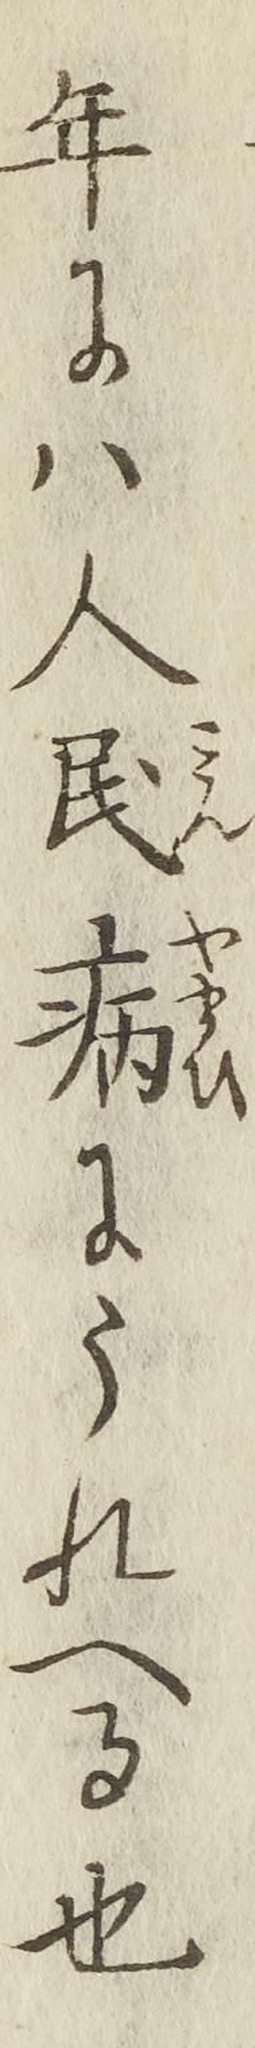年には人民病にうれへる也
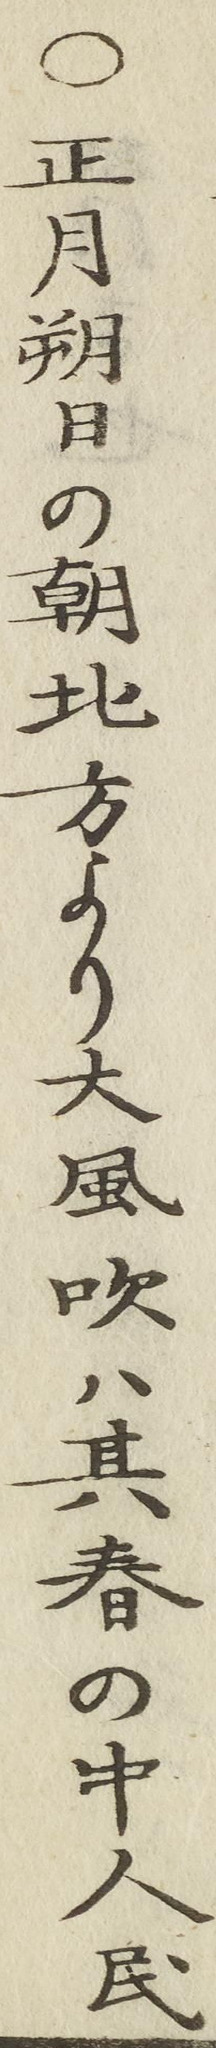〇正月朔日の朝北方より大風吹は其春の中人民
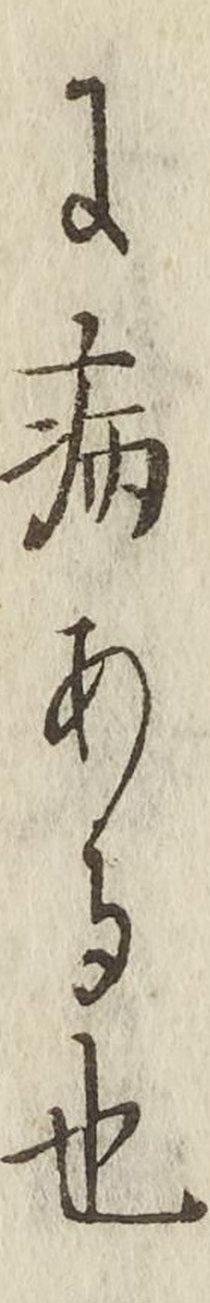に病ある也
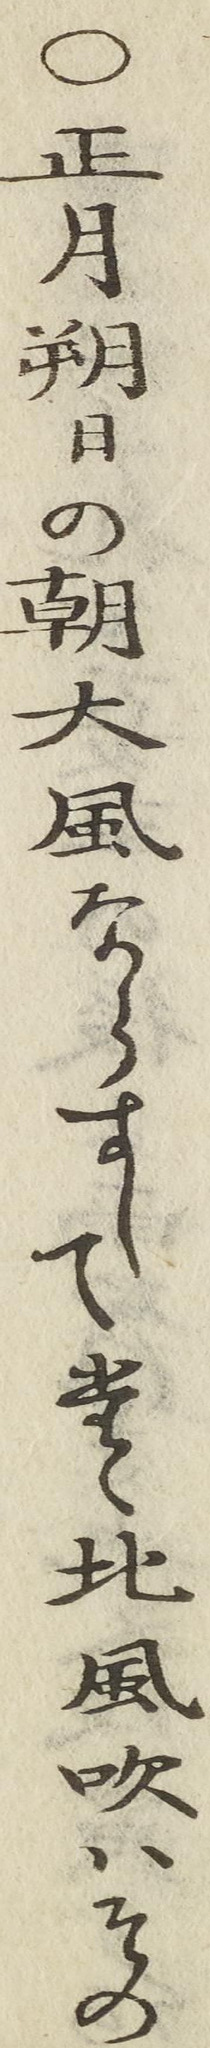〇正月朔日の朝大風ならすしてたゝ北風吹はその
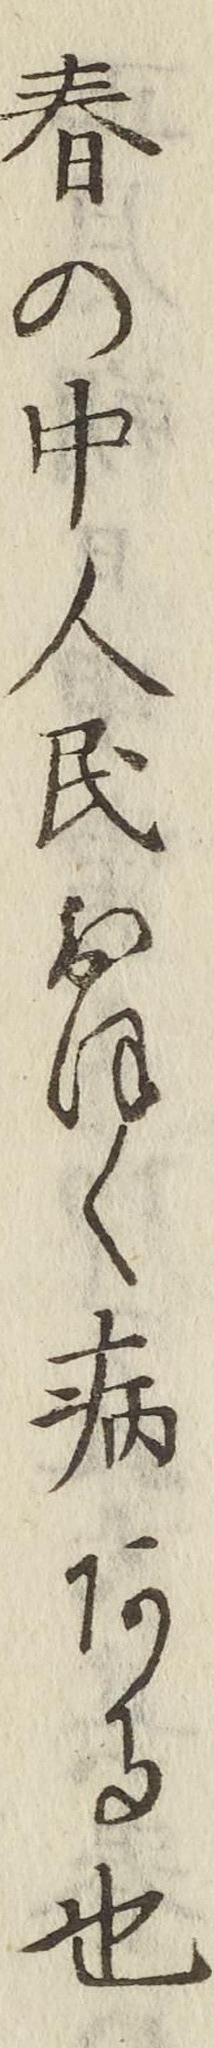春の中人民おほく病ある也
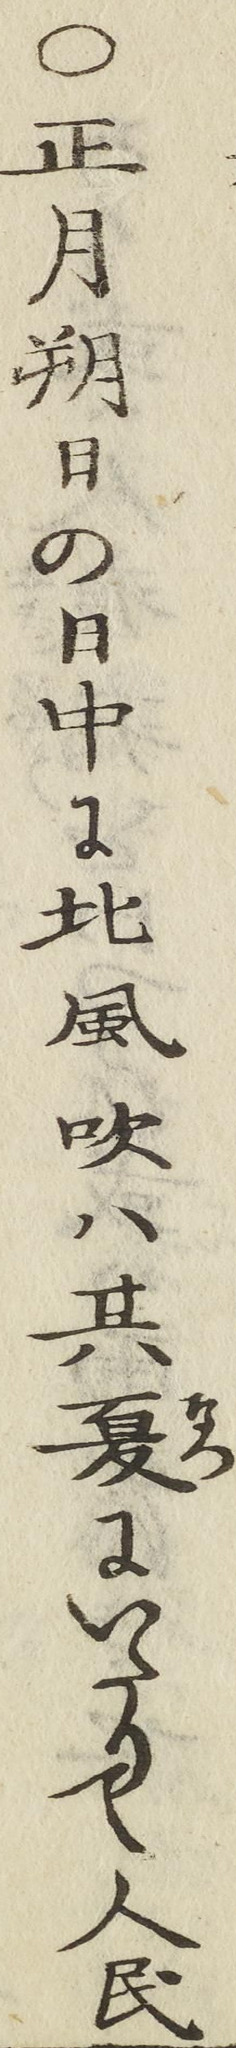〇正月朔日の日中に北風吹は其夏にいたりて人民
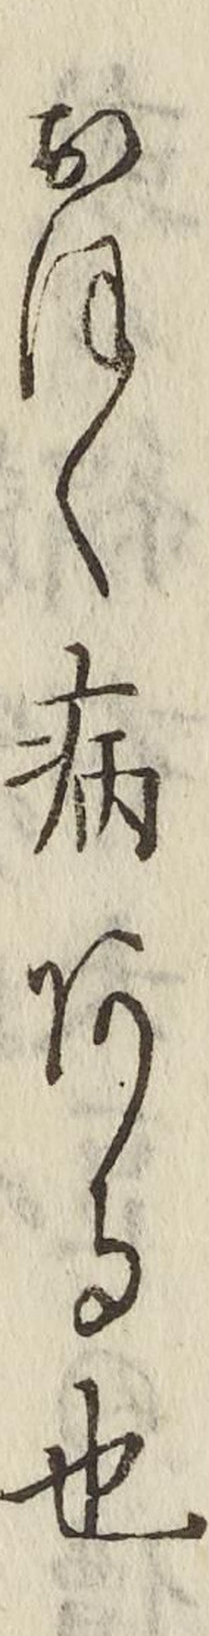おほく病ある也
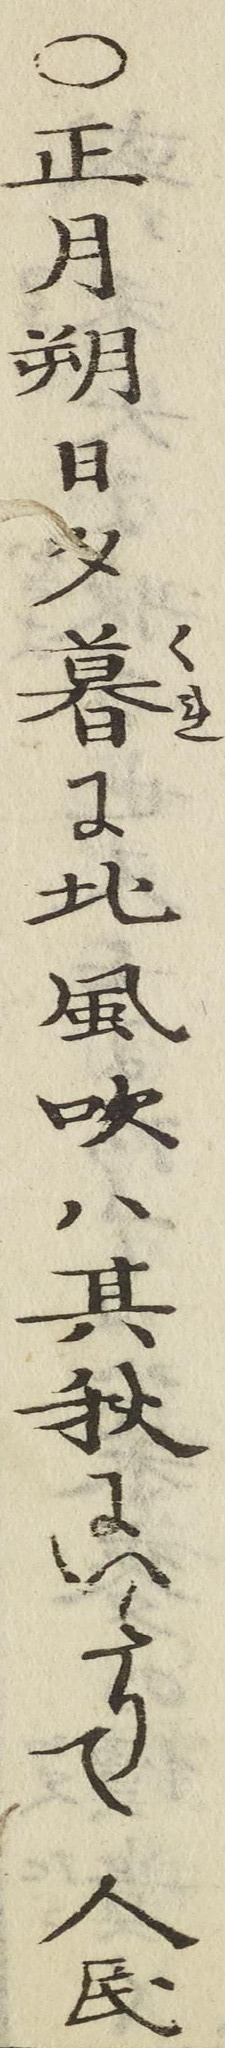〇正月朔日夕暮に北風吹は其秋にいたりて人民
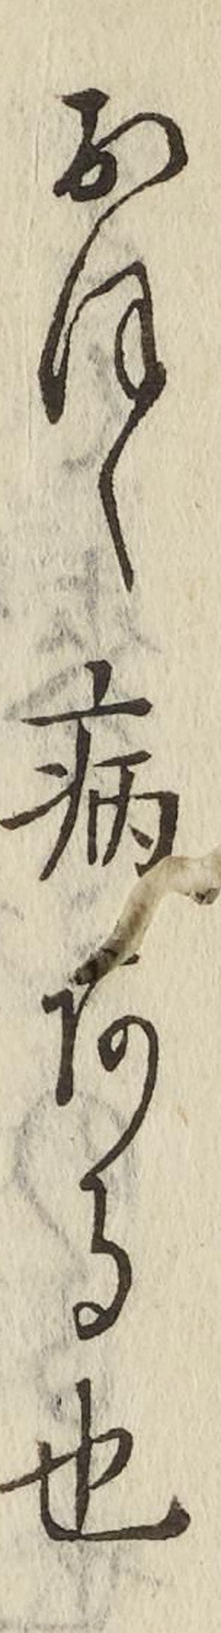おほく病ある也
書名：天時占候　二
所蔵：東京大学地震研究所図書室 Earthquake Research Institute Library, The University of Tokyo, JAPAN
